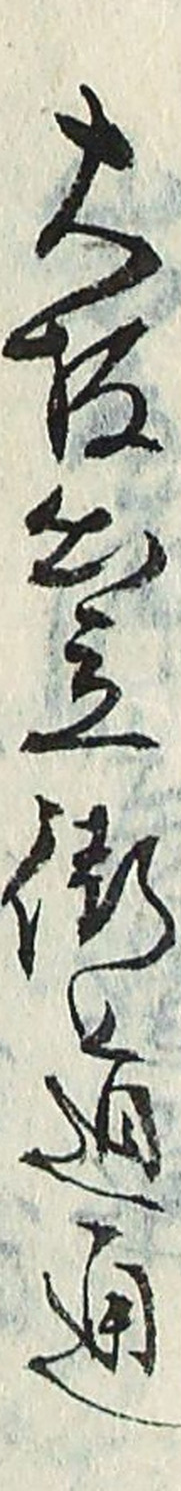大坂出立街道通
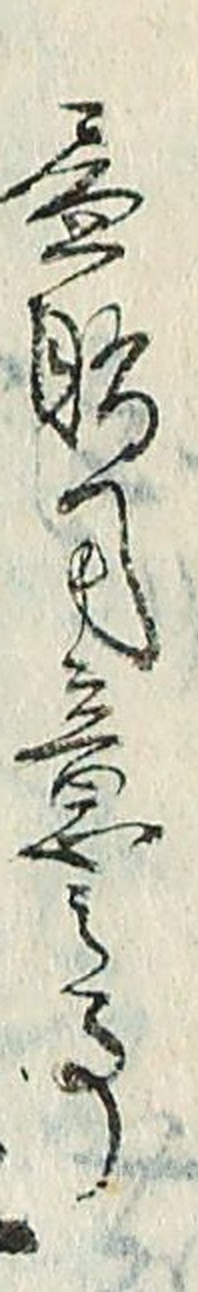昼賄用意之事
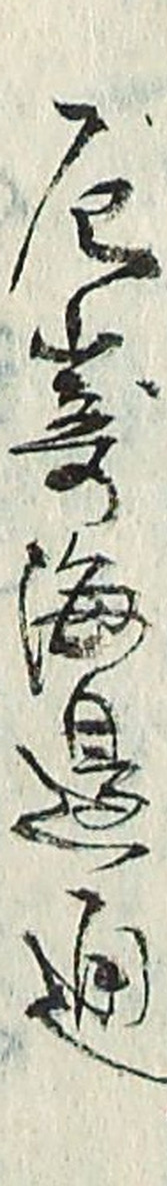尼崎海辺通
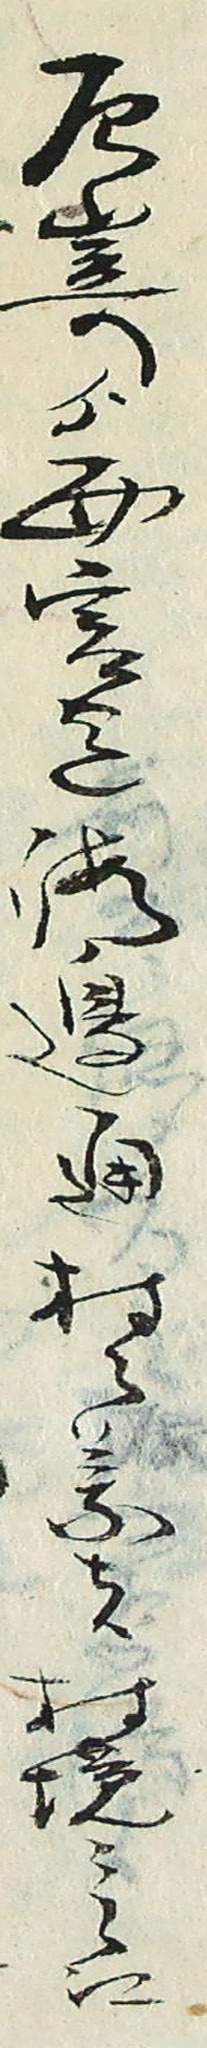尼崎ゟ西宮迄海辺通村々義は村境々々え
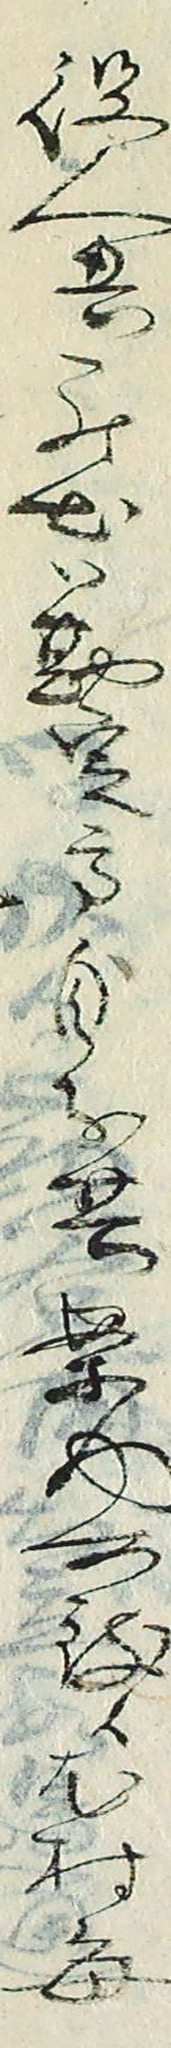役人共罷出御勘定方自分共案内可致候尤村毎
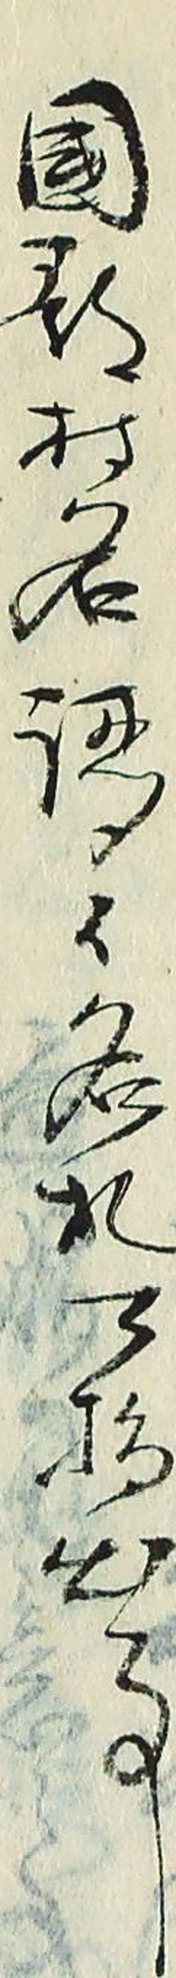国郡村名認め候名札可指出事
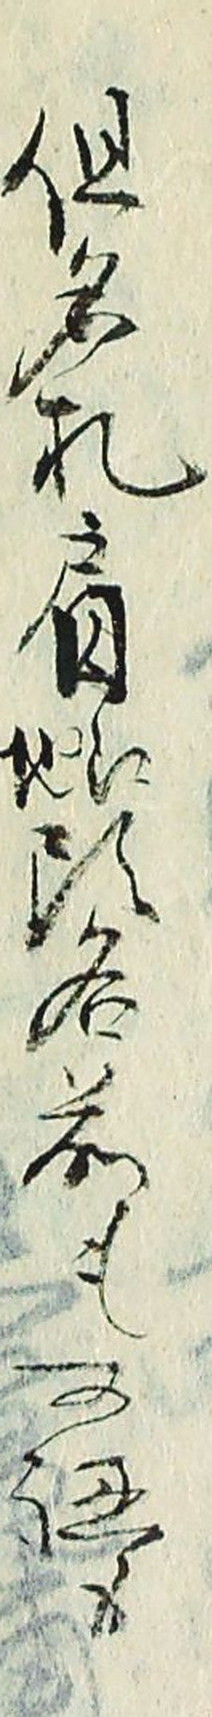但名札肩え地頭名前も可認候
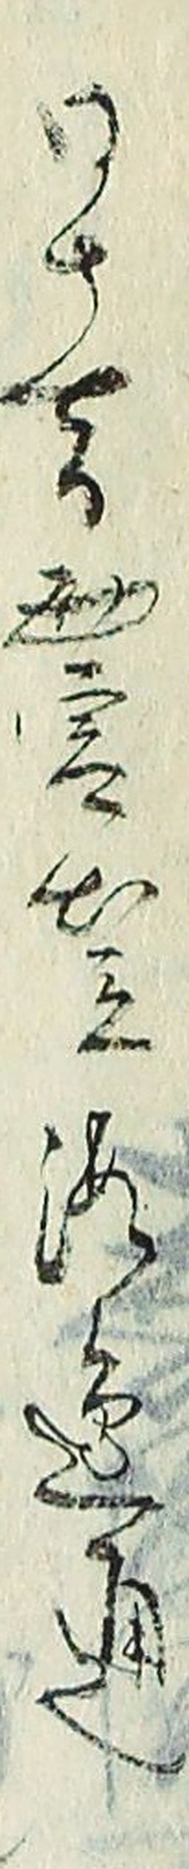同十七日西宮出立海辺通
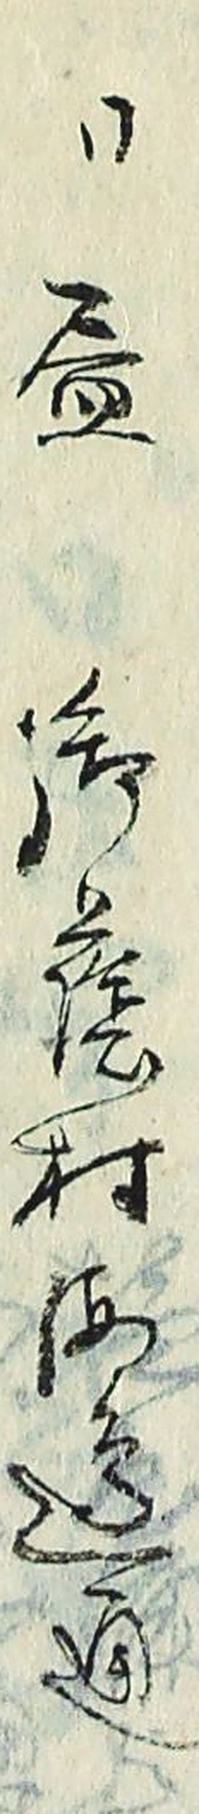同昼御蔭村海辺通
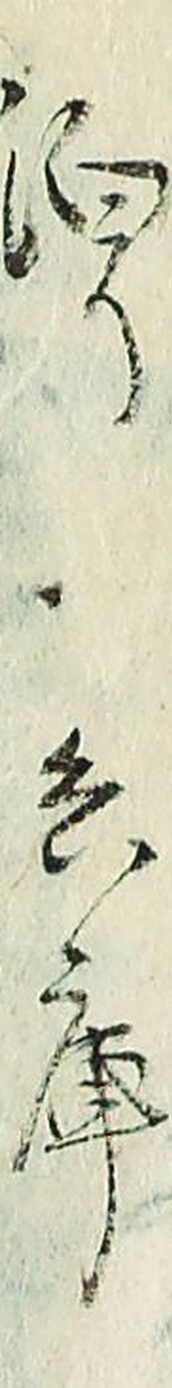泊り兵庫
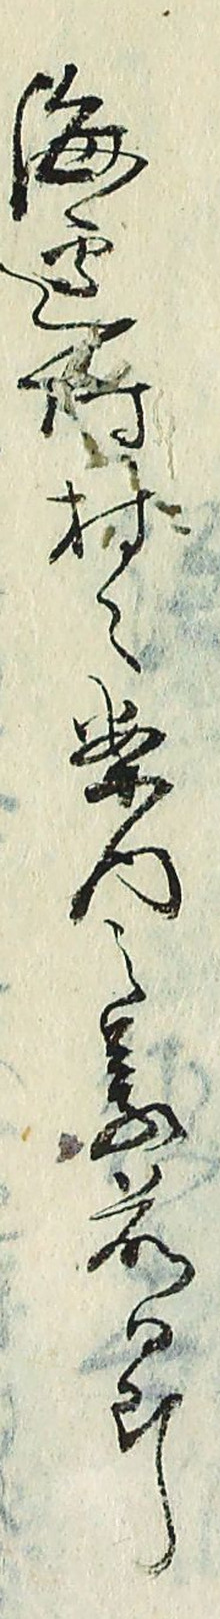海辺附村々案内之義前同断
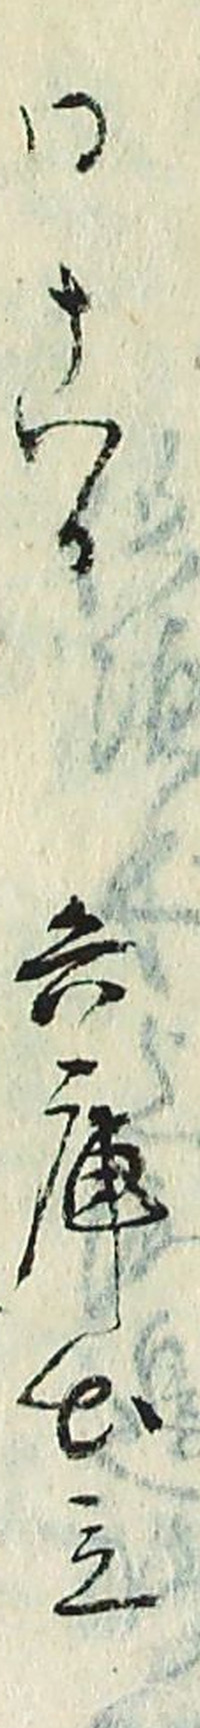同十八日兵庫出立
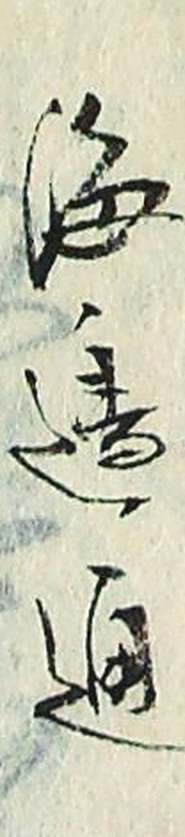海辺通
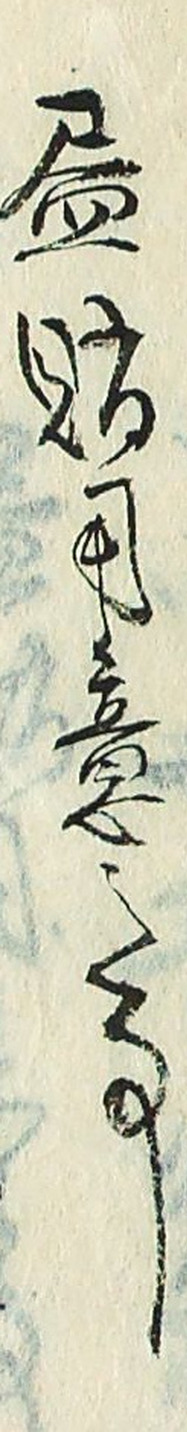昼賄用意之事
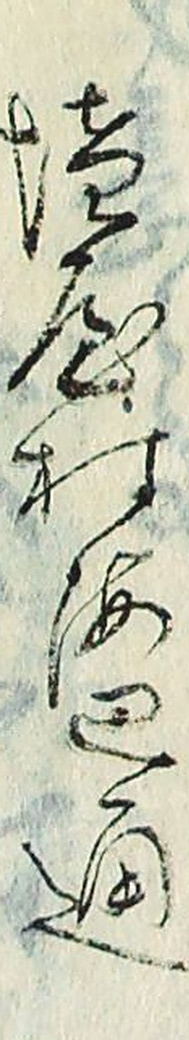塩屋村海辺通
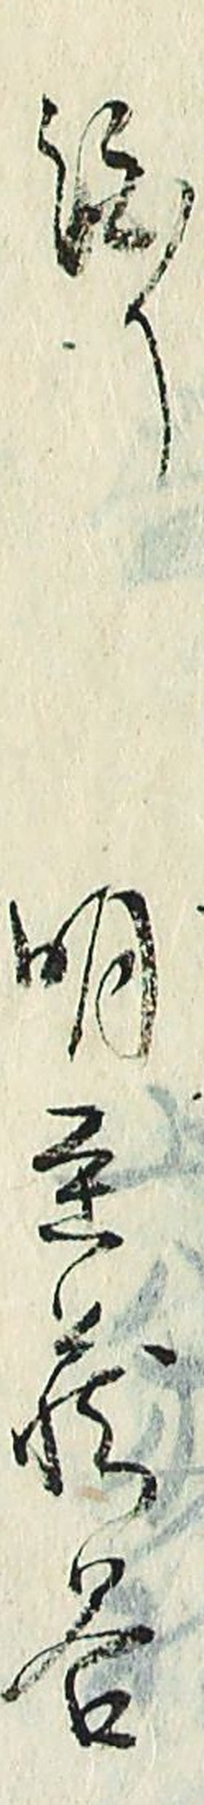泊り明至蔵谷
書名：公辺御役人為御廻浦御立越諸御用一巻
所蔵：鳴門教育大学 Naruto University of Education
